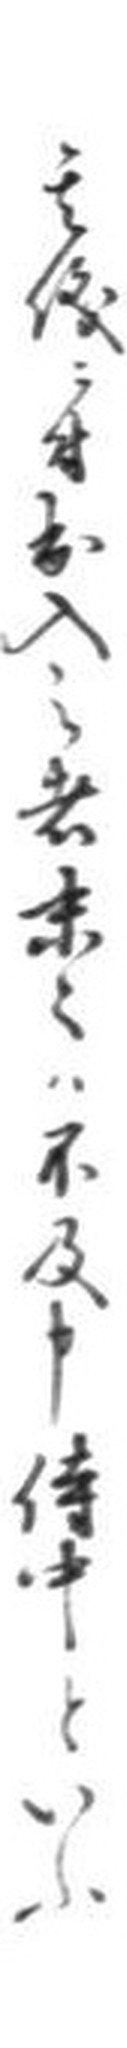其儀ニ付出入之者末々ハ不及申侍中といふ
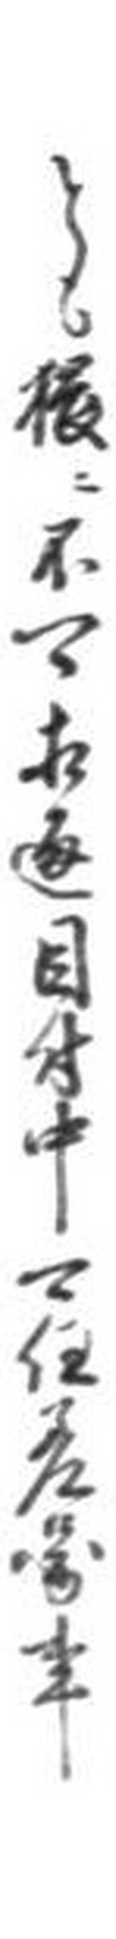とも猥ニ不可相通目付中可任差図事
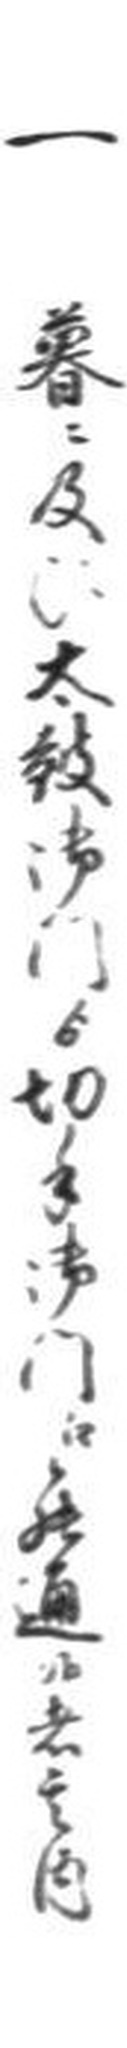一暮ニ及ひ太鼓御門ゟ切手御門江罷通候者其内
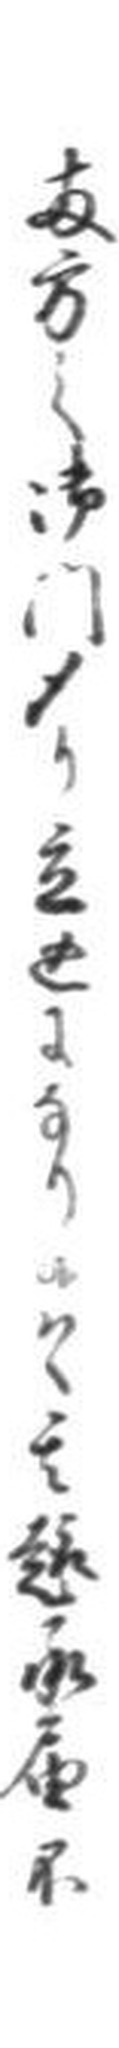両方之御門〆り立込になり候ハヽ其趣承届不
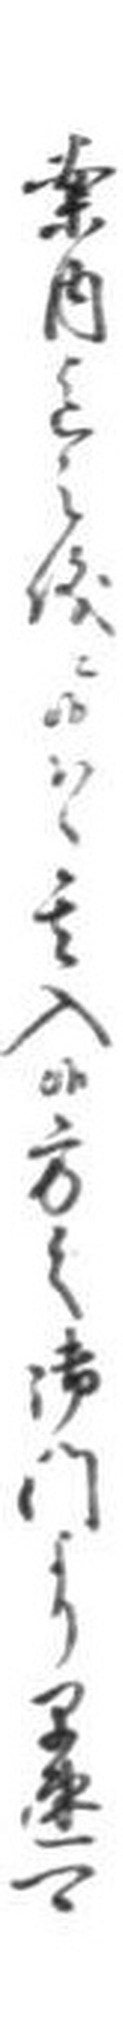案内迄之儀ニ候ハヽ其入候方之御門より早速可
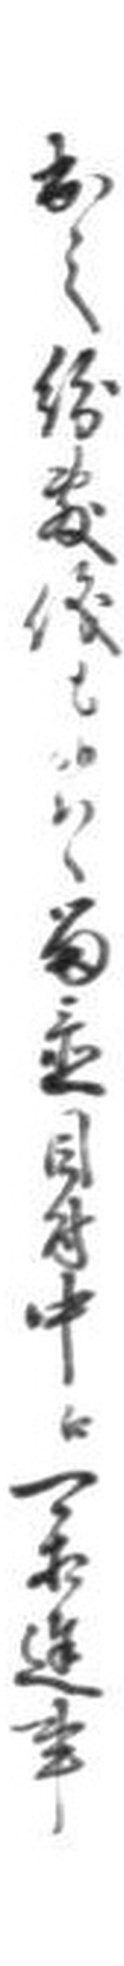出之紛敷儀も候ハヽ留置目付中江可相達事
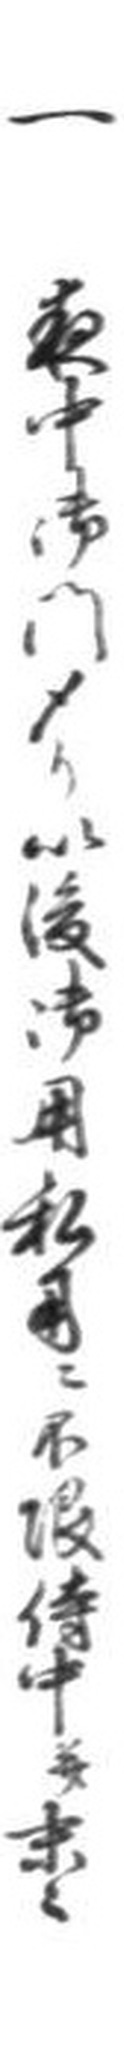一夜中御門〆り以後御用私用ニ不限侍中并末々

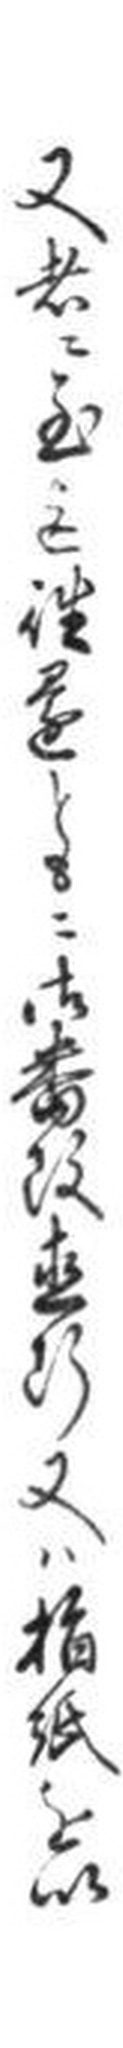又者ニ至迄往還ともニ御番改直断又ハ指紙を以
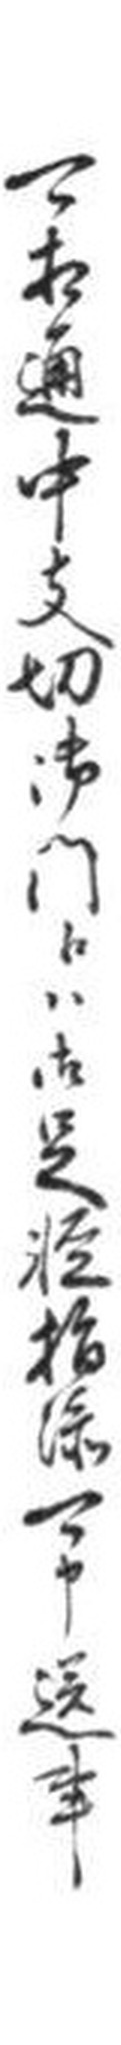可相通中支切御門江ハ御足軽指添可申送事
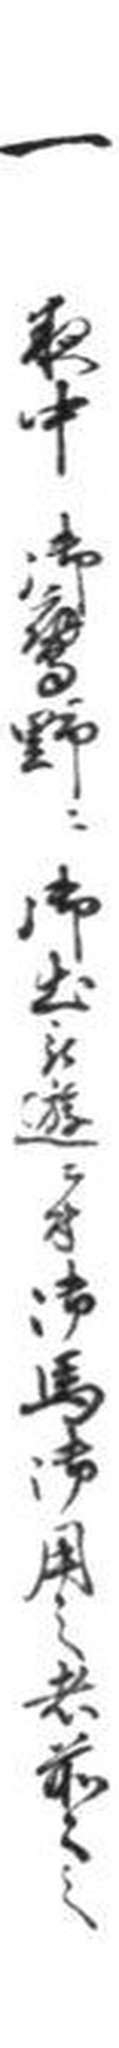一夜中御鷹野ニ御出被遊ニ付御馬御用之者前々之
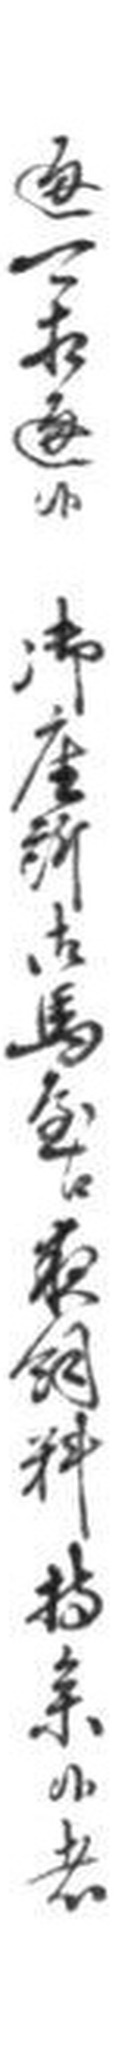通可相通候御座所御馬屋江夜飼料持参候者
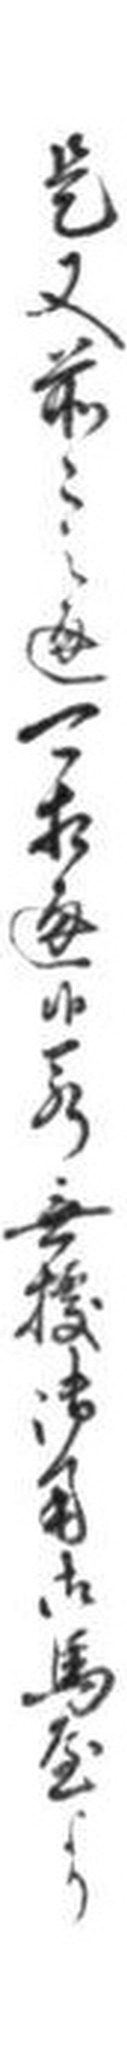是又前々之通可相通候若無拠御用御馬屋より
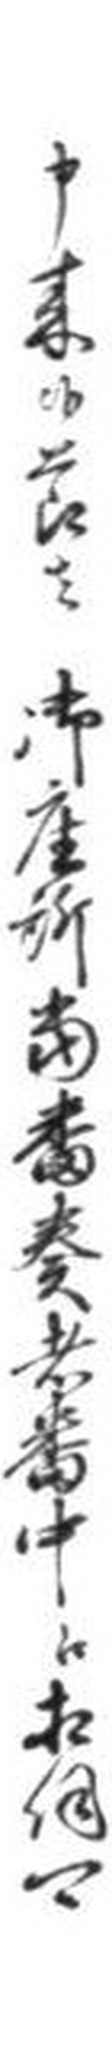申来候節者御座所当番奏者番中江相伺可
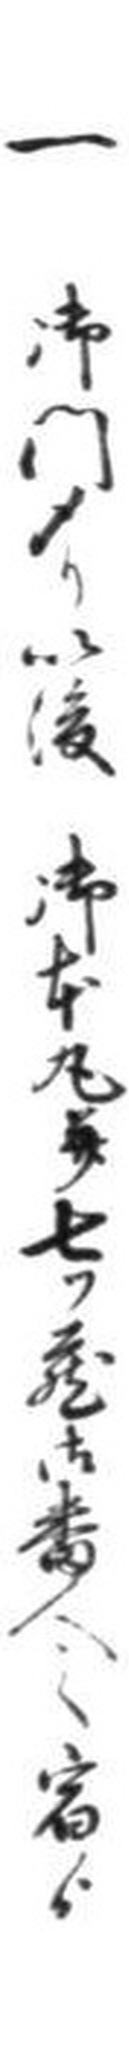一御門〆り以後御本丸并七ツ蔵御番人之宿ゟ
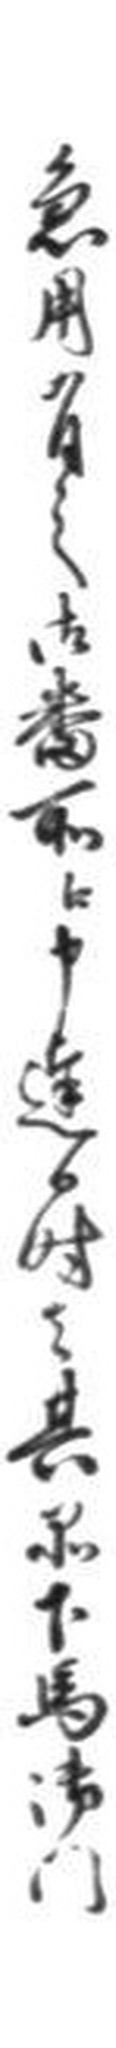急用有之御番所江申達候時者其品下馬御門
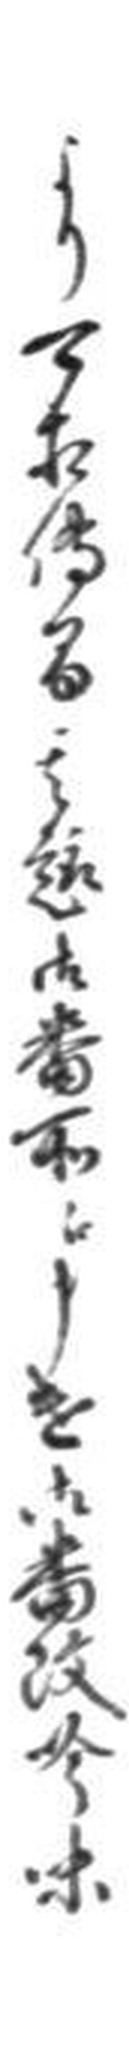より可相伝間其趣御番所江申遣御番改吟味
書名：家譜 三十三 吉邦公 享保四年
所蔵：福井県文書館 Fukui Prefectural Archives
